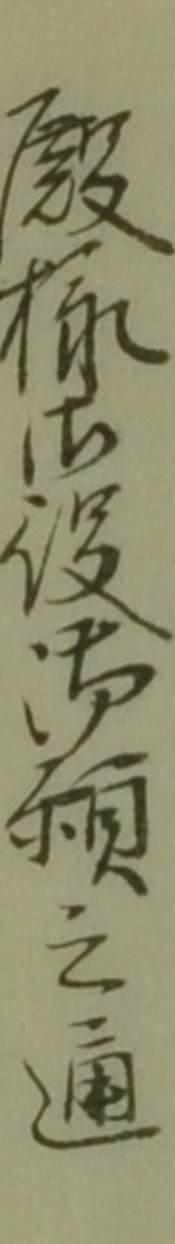殿様御役御願之通
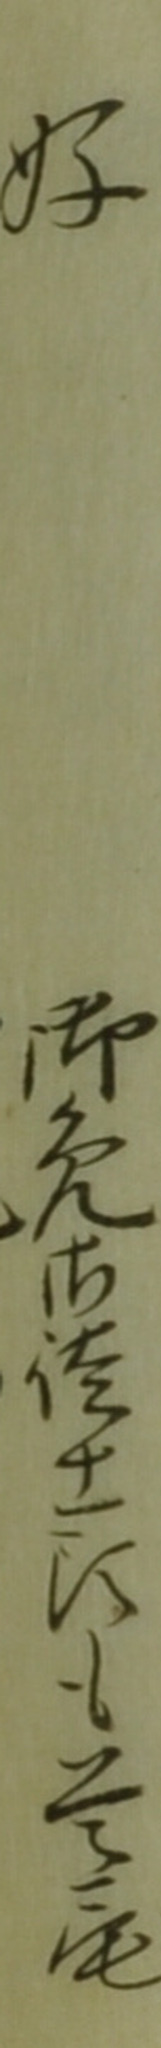好御免御徒士頭も首尾
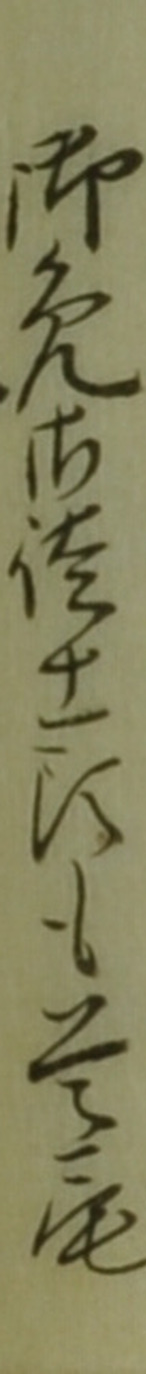好御免御徒士頭も首尾
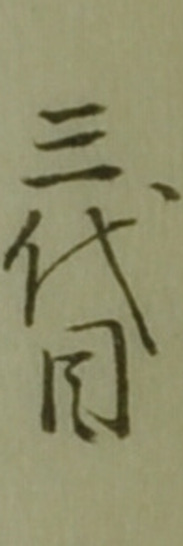三代目
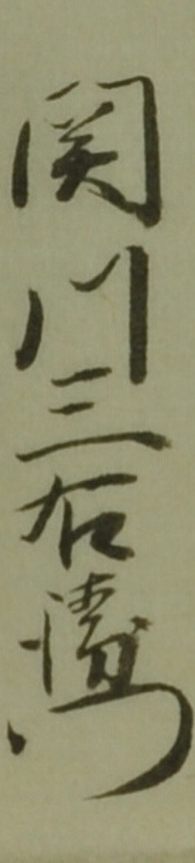関川三右衛門
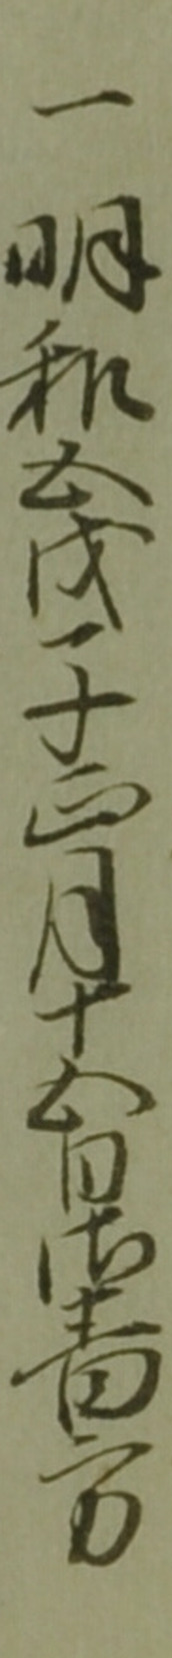一明和五戊子正月十五日御番方
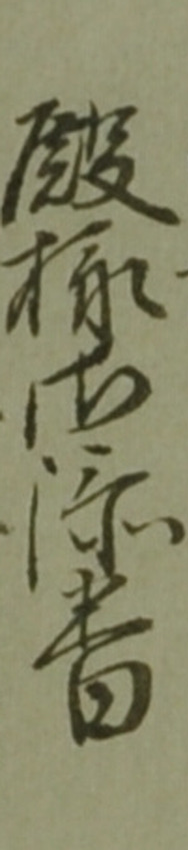殿様御添番
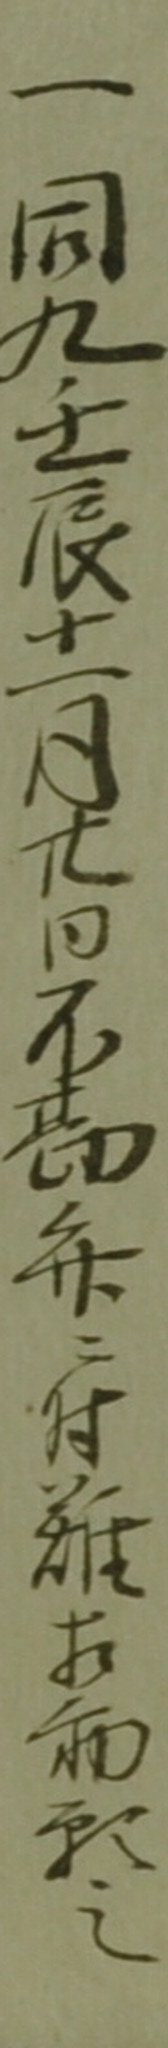一同九壬辰十一月廿日不勘弁ニ付難相勤願之
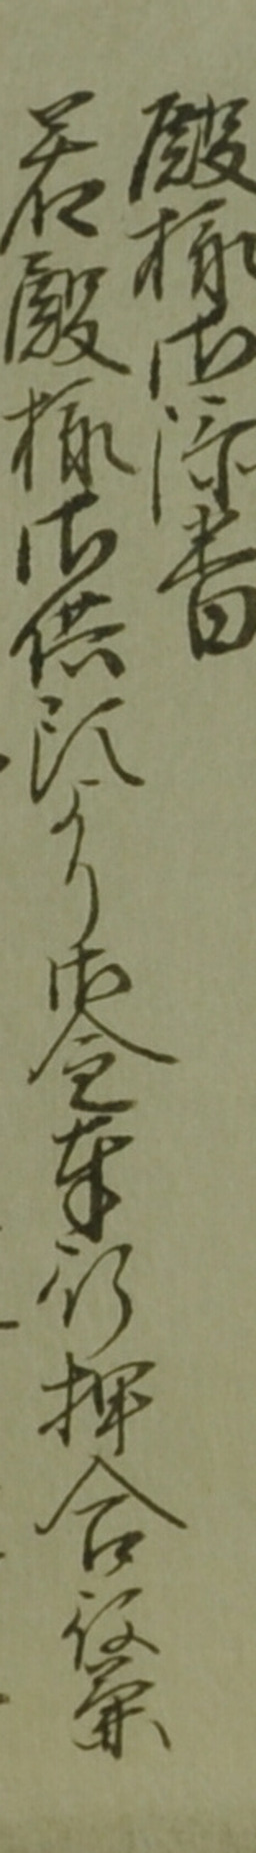若殿様御供頭より御金奉行押合役兼
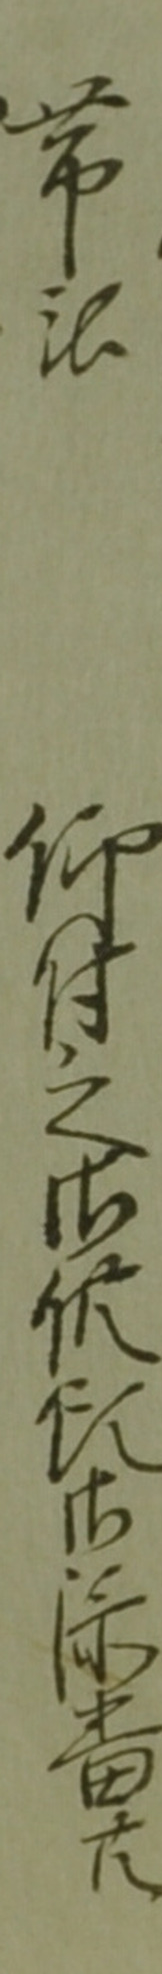帯被仰付之御供頭御添番共
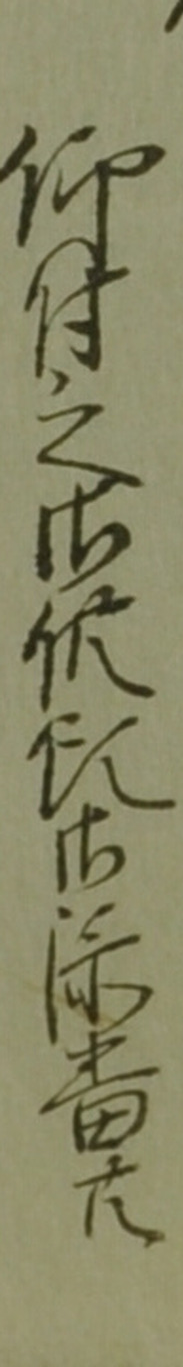帯被仰付之御供頭御添番共
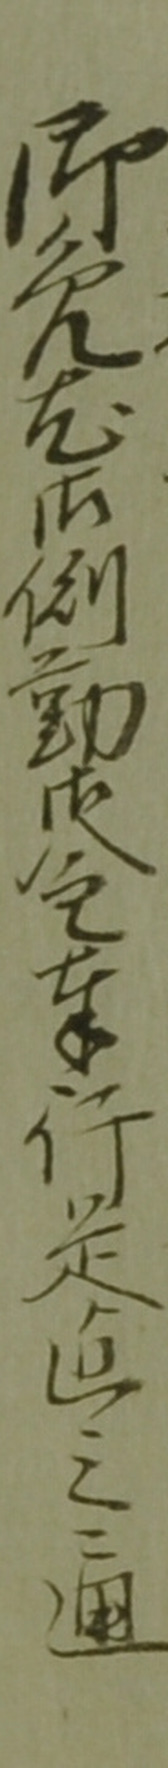御免尤御側勤御金奉行是迄之通
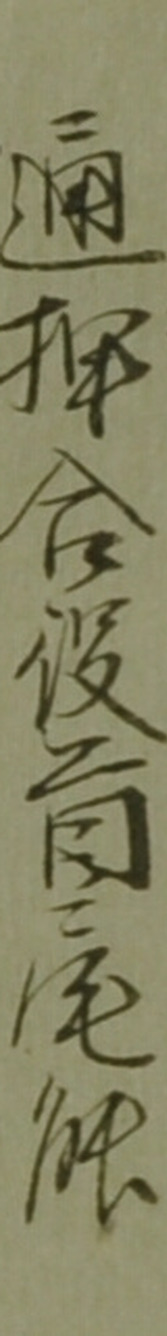通押合役首尾能
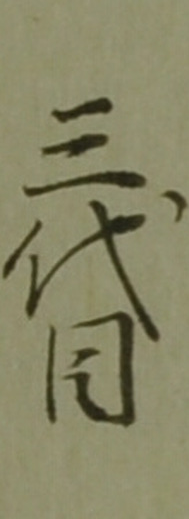三代目
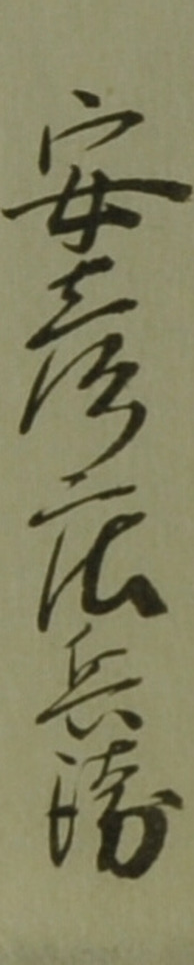安彦庄兵衛
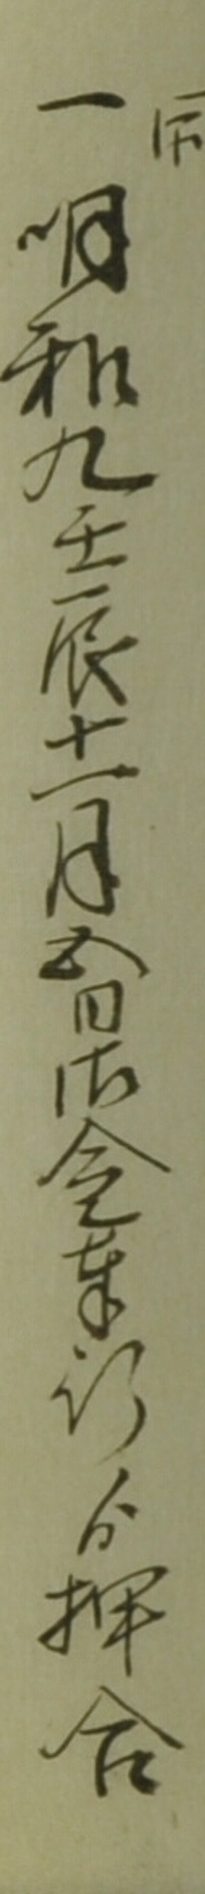一明和九壬辰十一月五日御金奉行ゟ押合
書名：諸御役代々録（七）
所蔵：伊那市立高遠町図書館・合同会社AMANE
